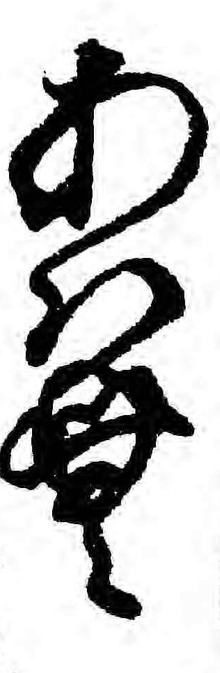あはむ
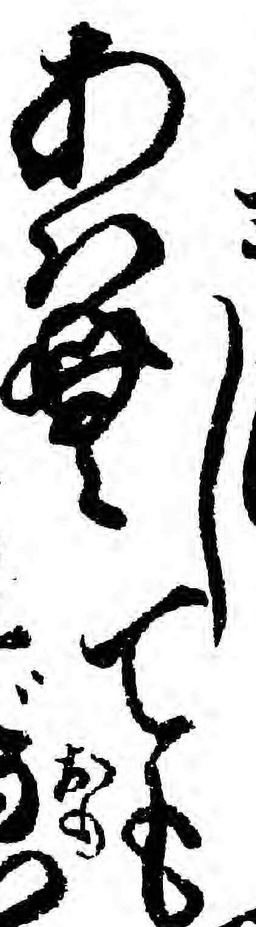あはむ
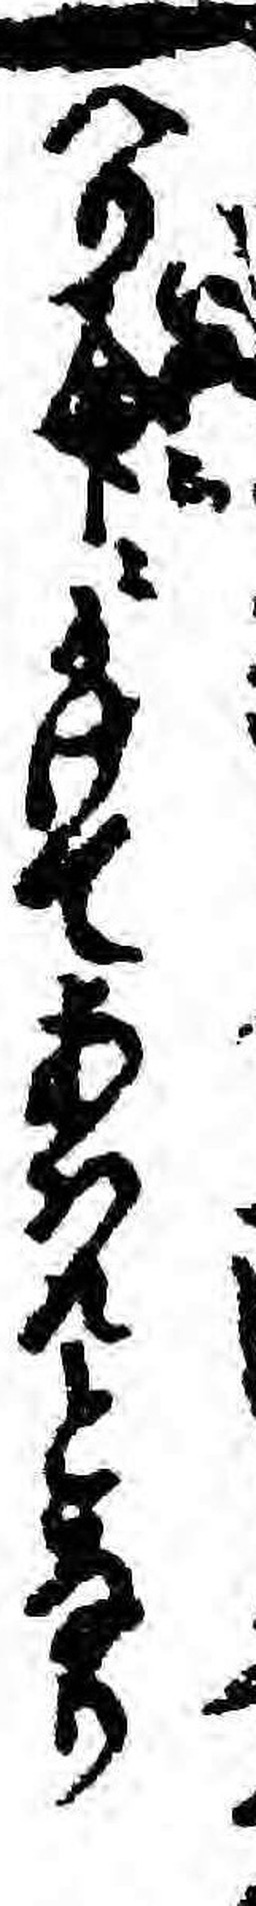へり命にかけてあはんとなり
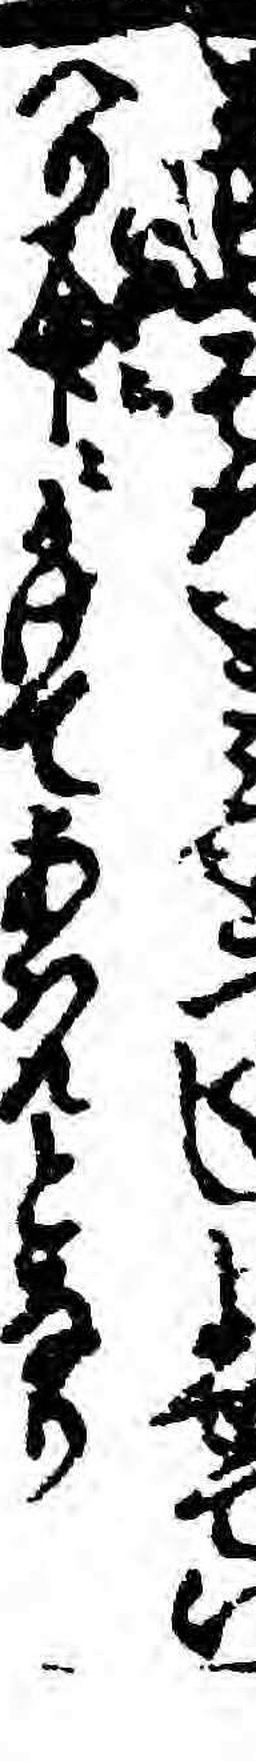へり命にかけてあはんとなり
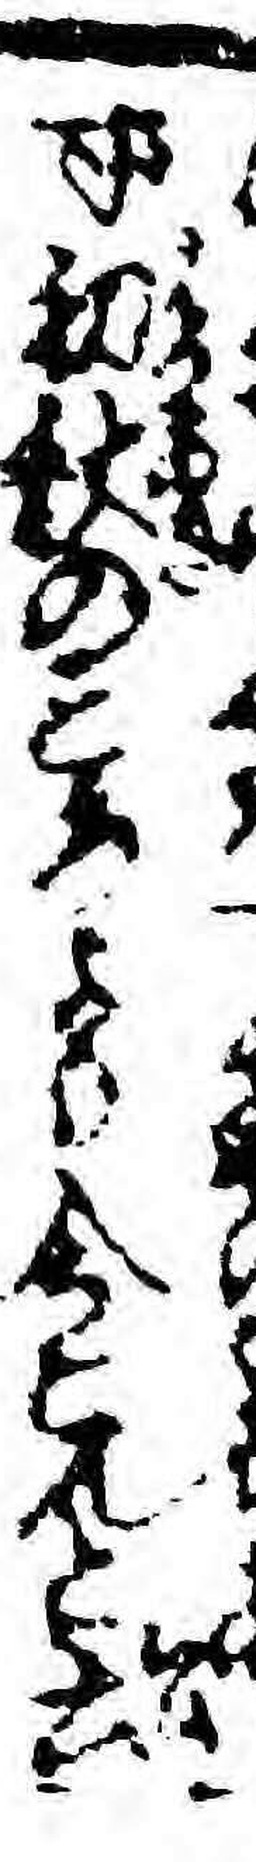ず初秋のころより今こんと云
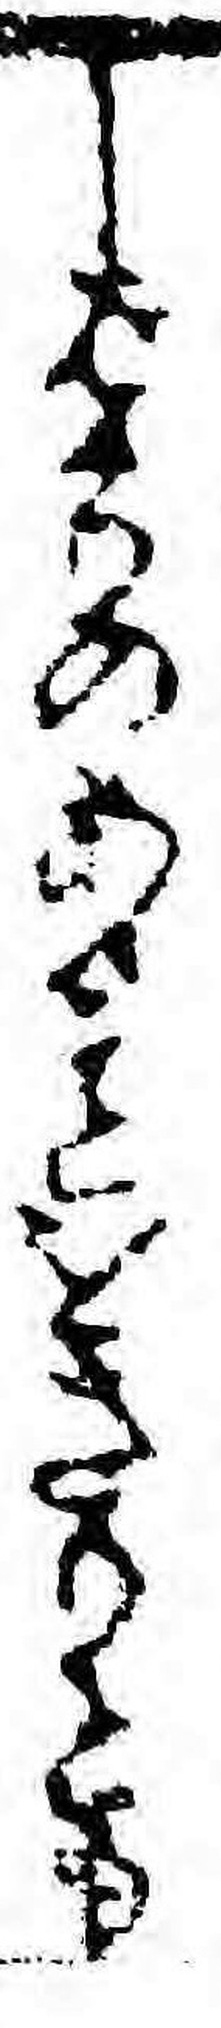しばかりのあることをさりとも
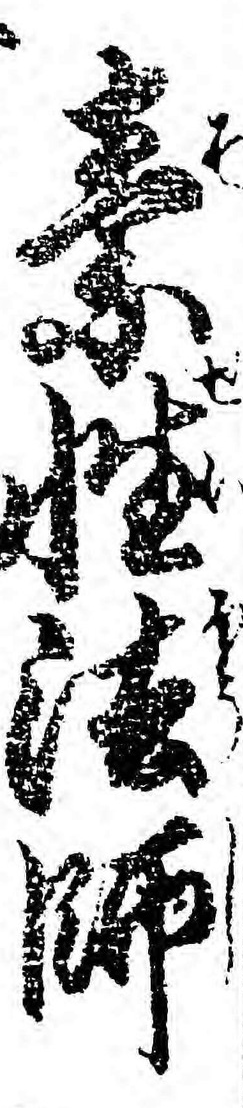素性法師
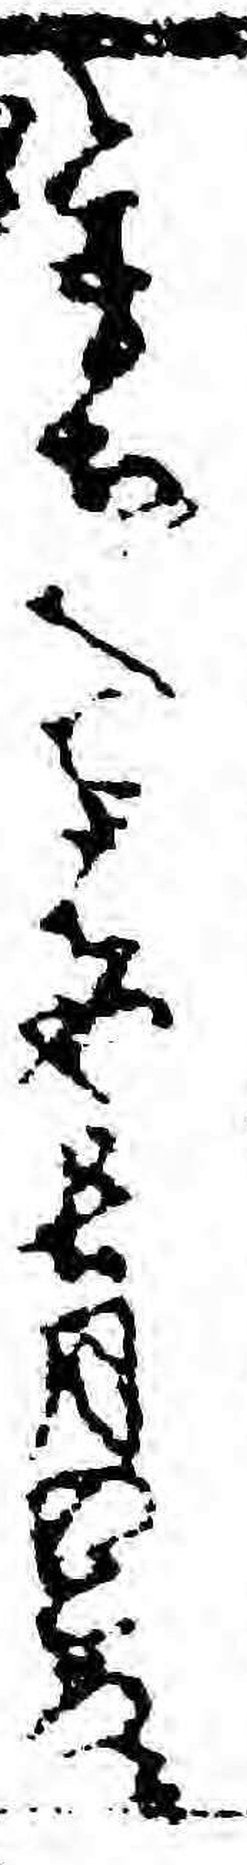とまち〳〵てはや長月のころに
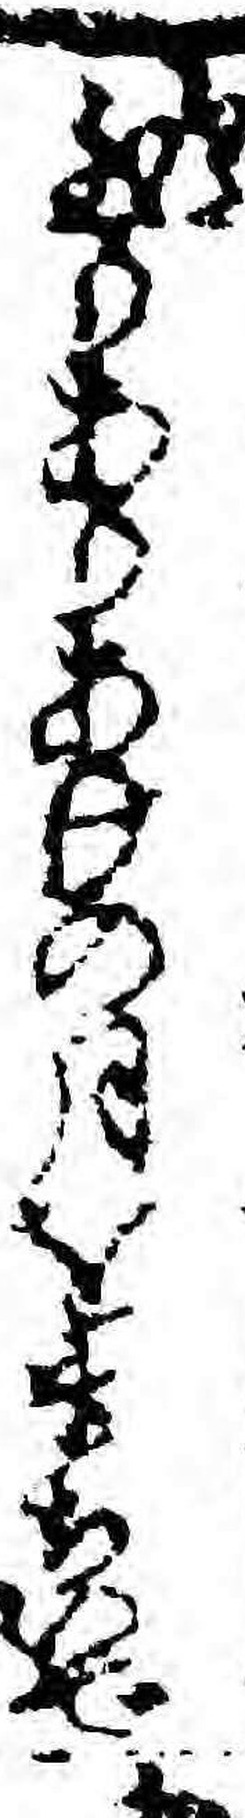至りありあけの月をまちいで
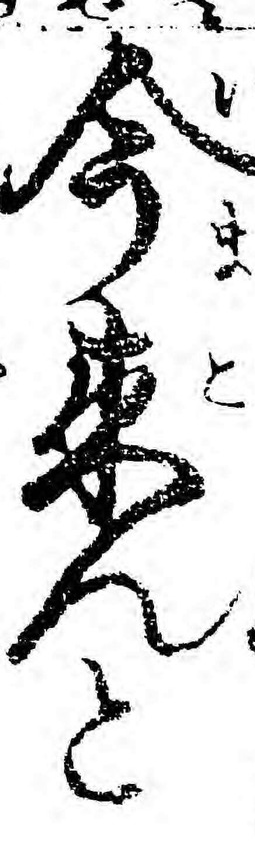今来んと
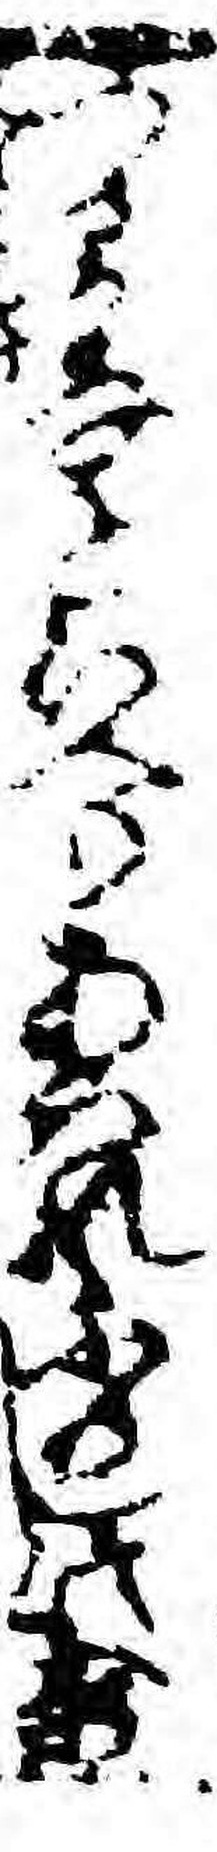つるかなといへりあはれふかし此哥
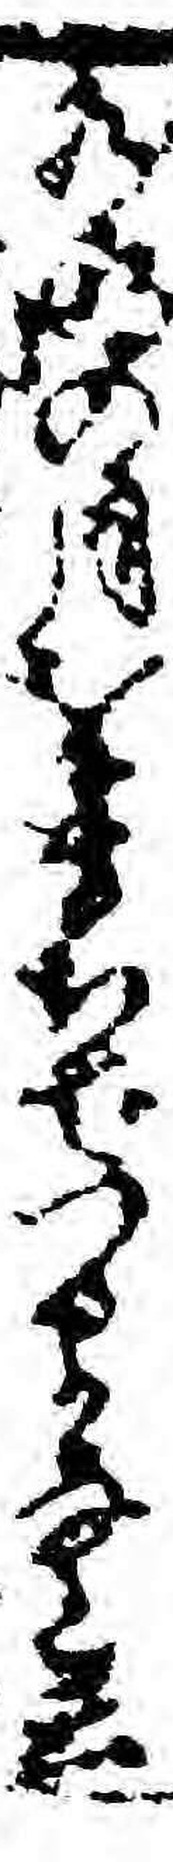有明の月をまちでつるかなと云
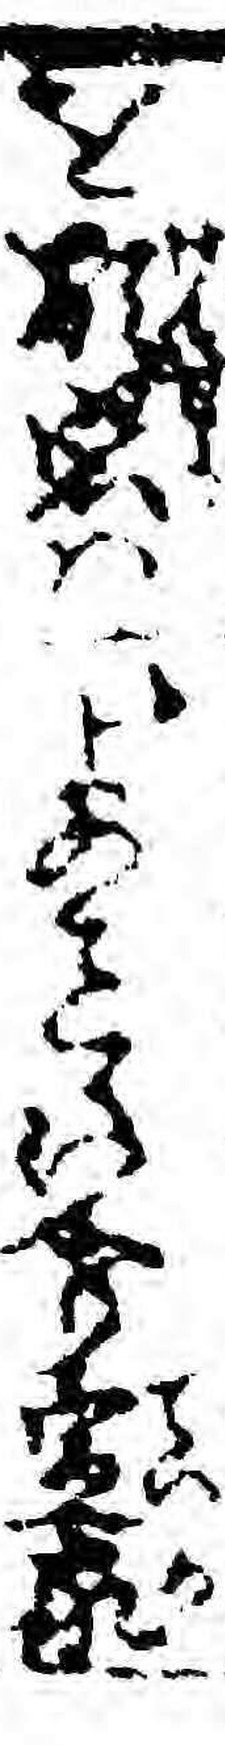を顕照は一トよのことゝいへり定家
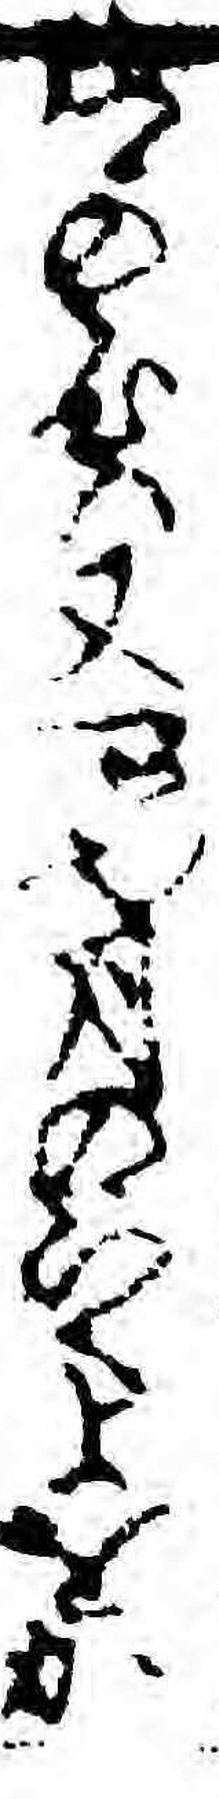卿の心は又一つ也月のいくよをか
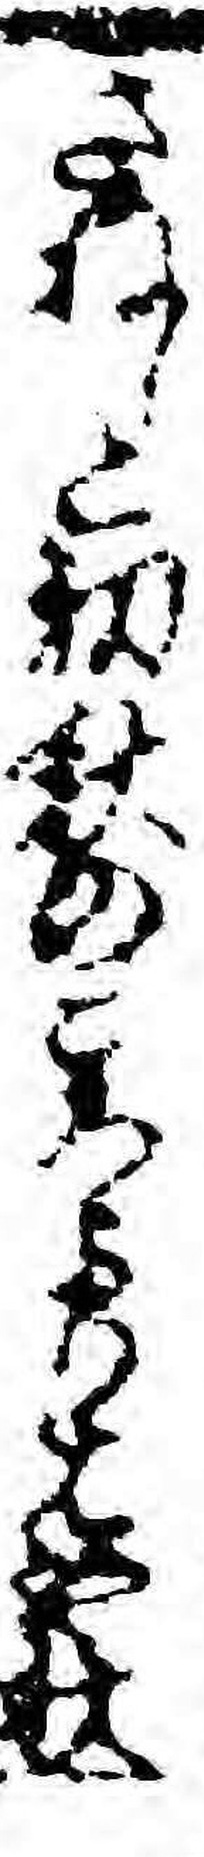さねしと初秋のころよりはや秋
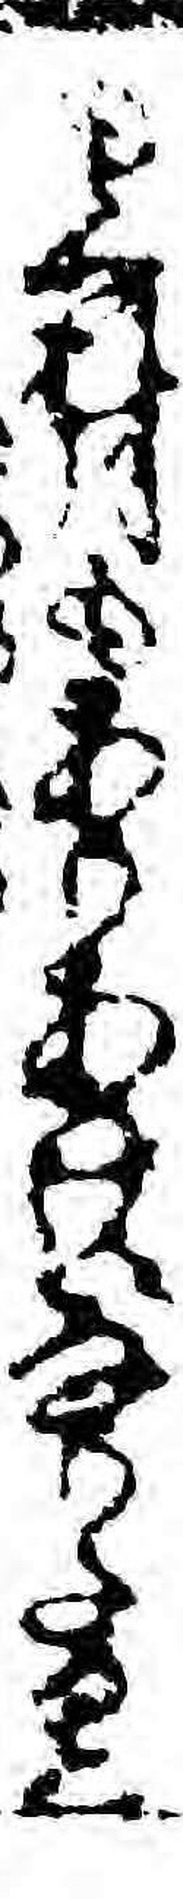もくれ月もありあけになりたると
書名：頭書和歌注譯／壽賀多百人一首小倉錦
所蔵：国文学研究資料館
